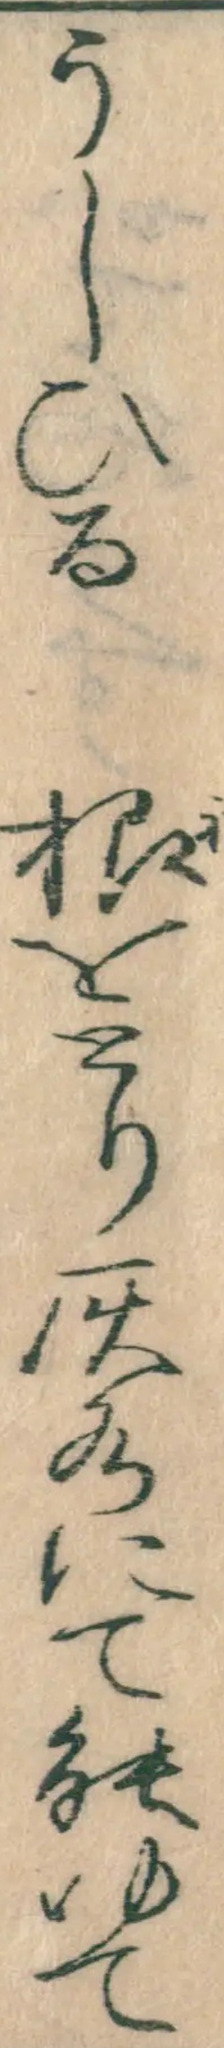うしひる根をとり灰水にて能ゆて

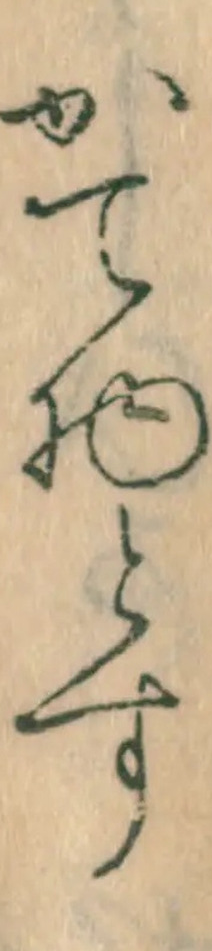かて物とす
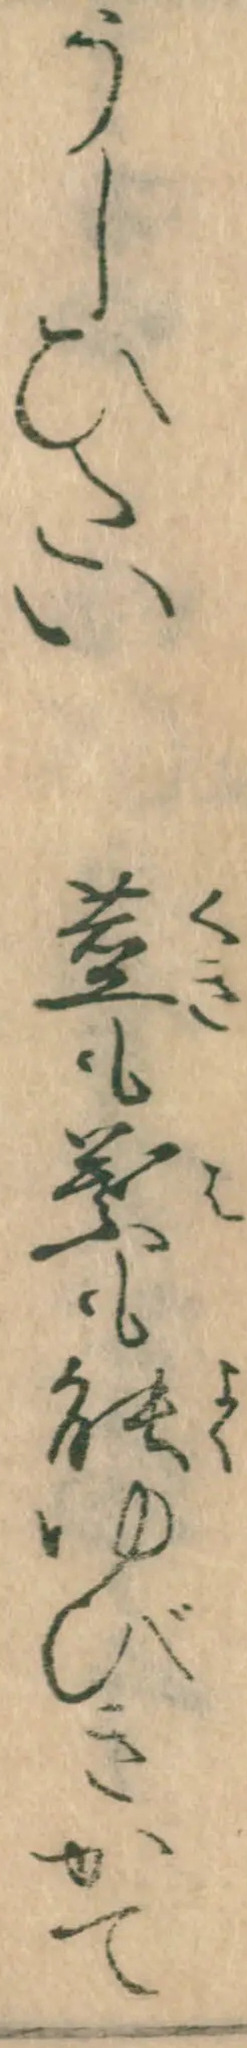うしひたい茎も葉も能ゆびきかて
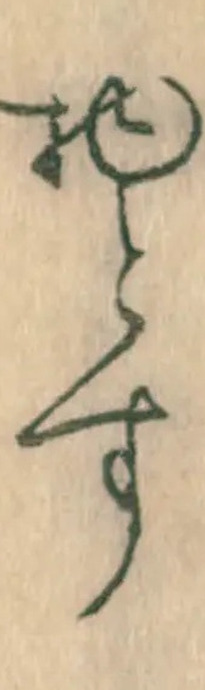物とす
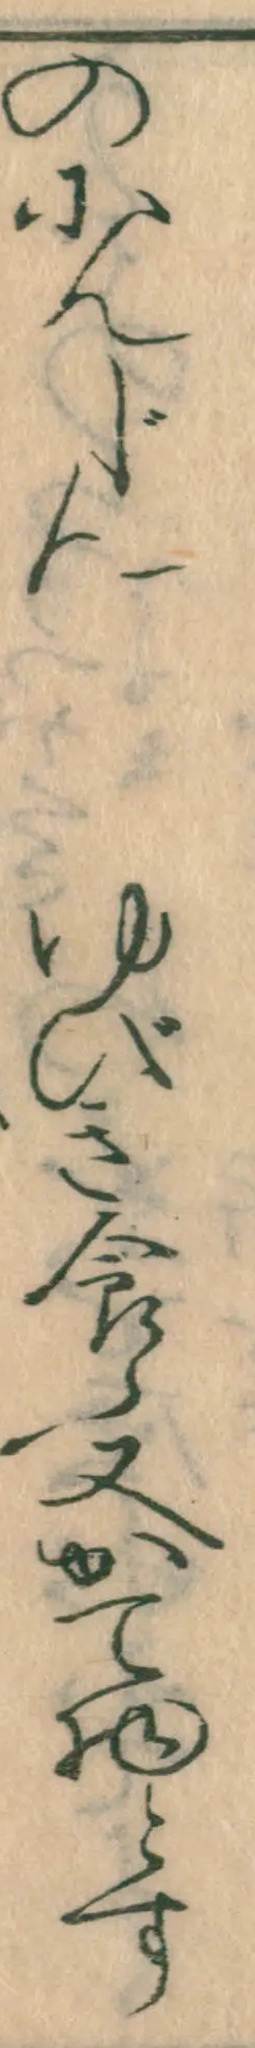のにんじんゆびき食ふ又かて物とす
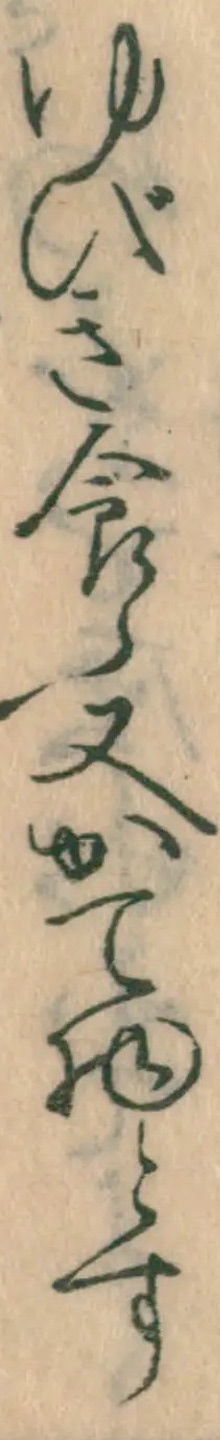去て食ふ又かて物とす
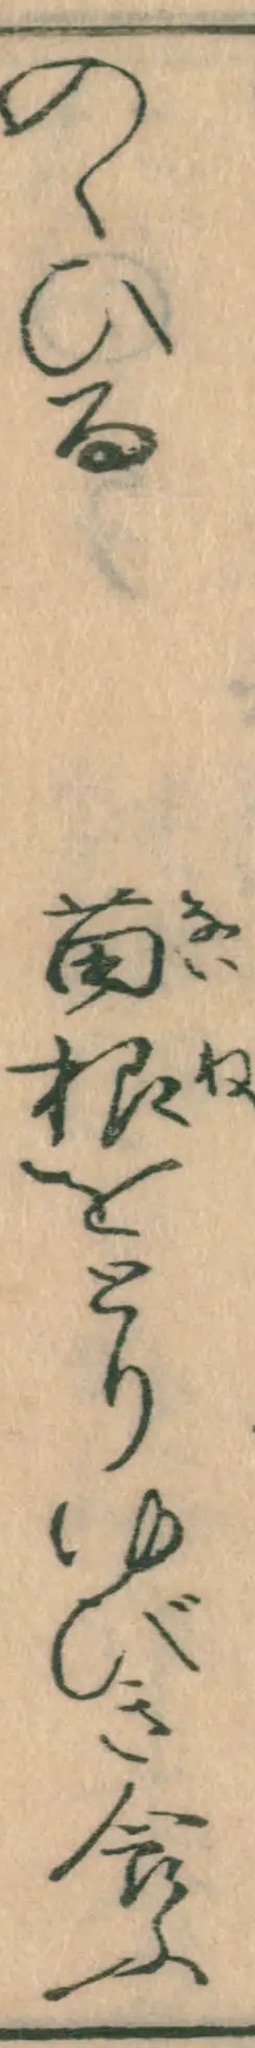のゝひる苗根をとりゆびき食ふ
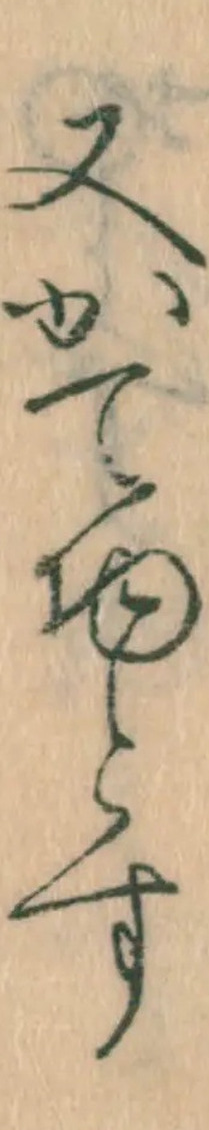又かて物とす
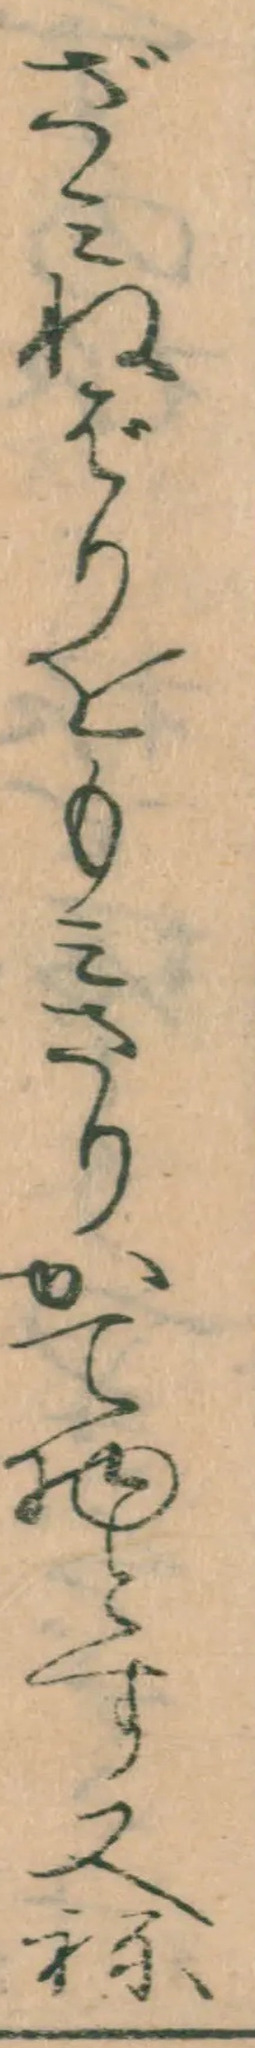ざみねばりをもみさりかて物とす又ね
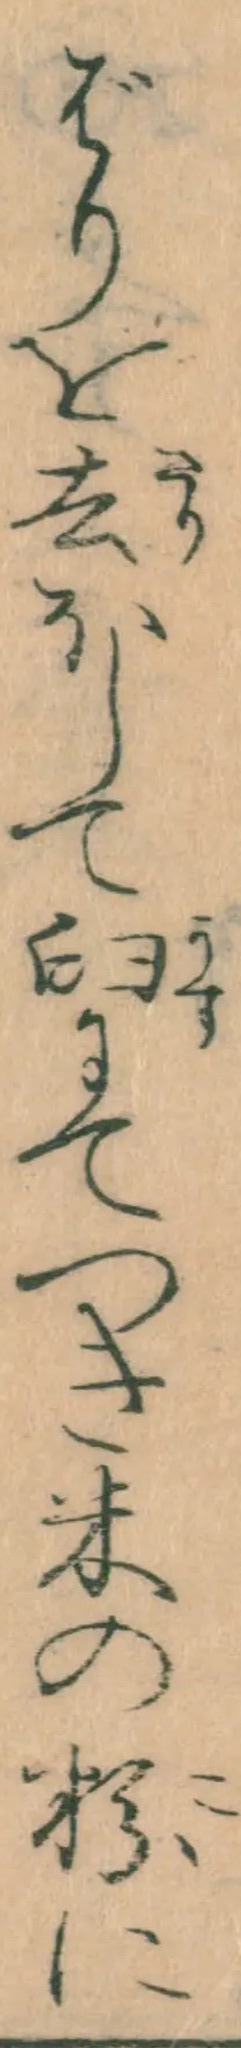ばりを去ほして臼にてつき米の粉に
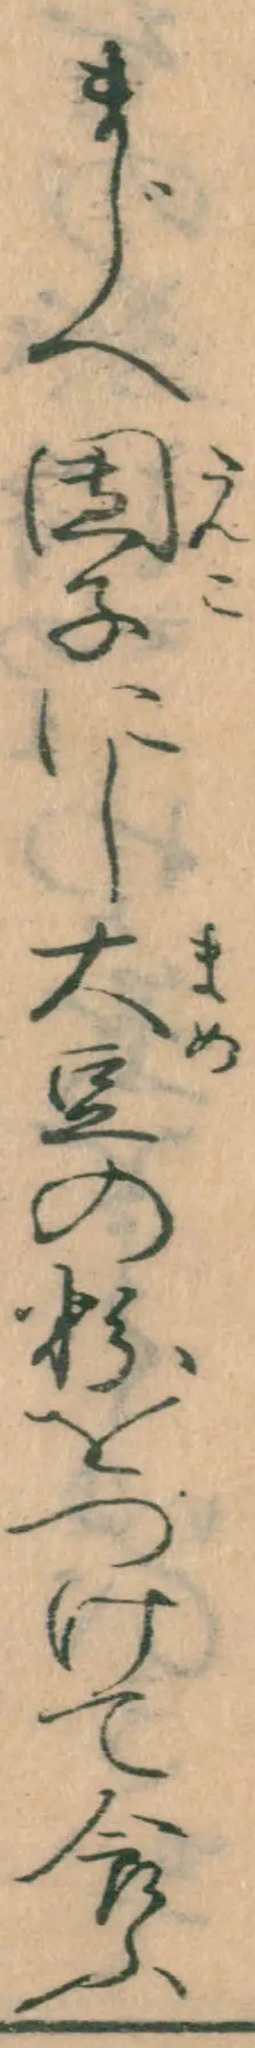まじへ団子にし大豆の粉をつけて食ふ
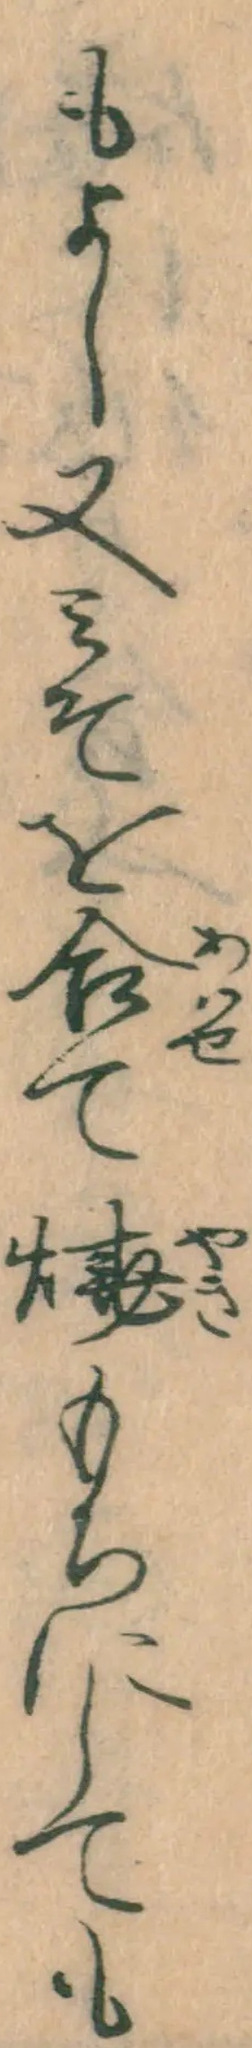もよし又みそを合て焼もちにしても
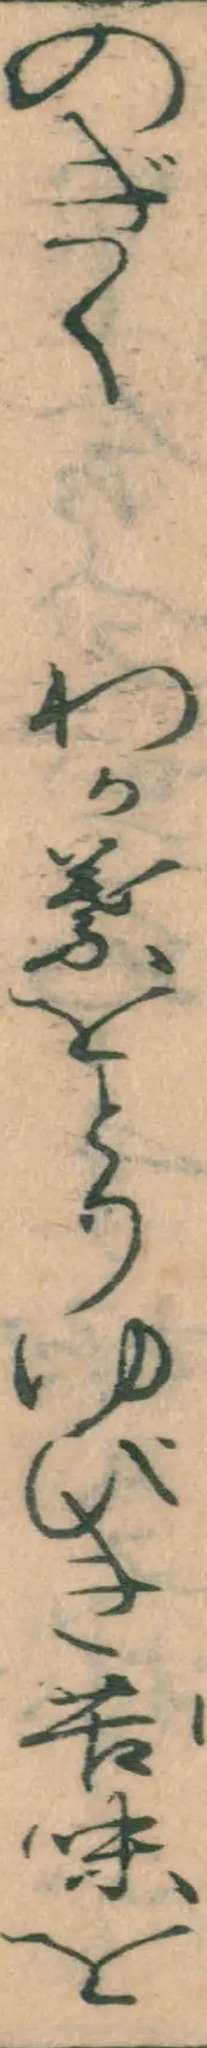のぎくわか葉をとりゆびき苦味を
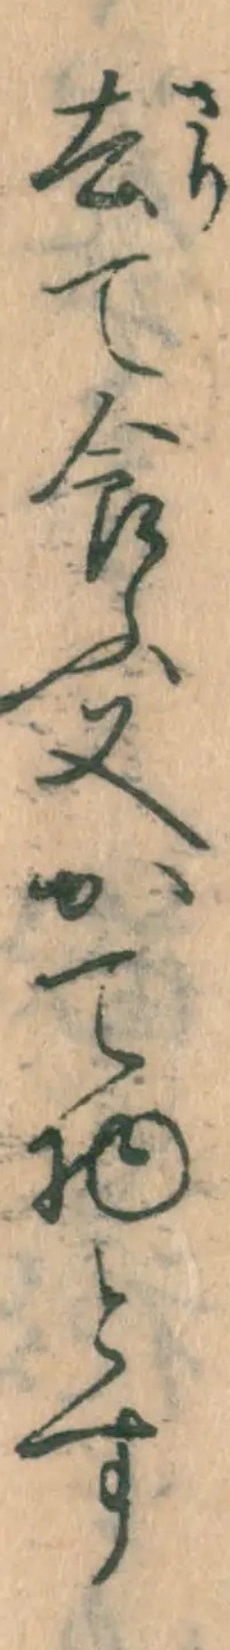去て食ふ又かて物とす

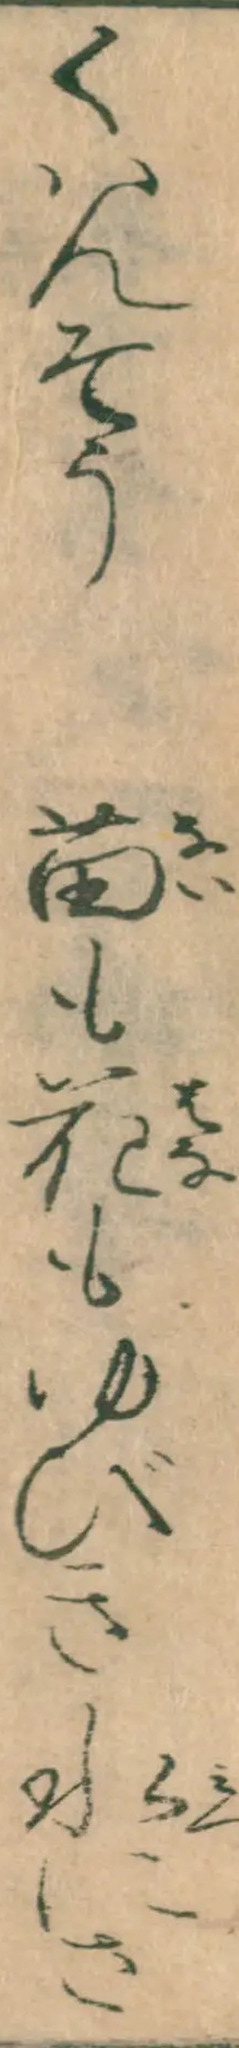くはんそう苗も花もゆびき水にさ
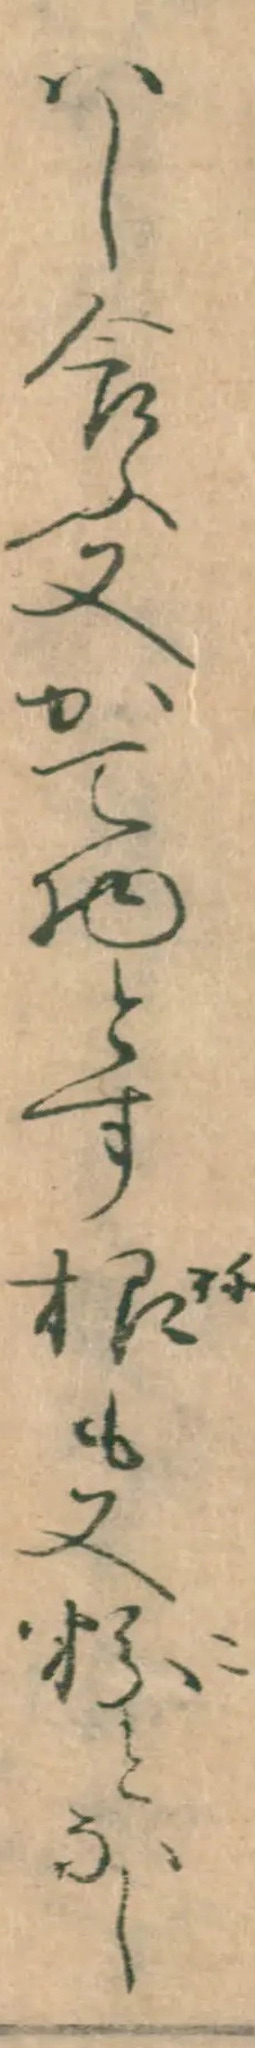はし食ふ又かて物とす根も又粉となし
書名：かてもの
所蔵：国立国会図書館 National Diet Library, JAPAN
